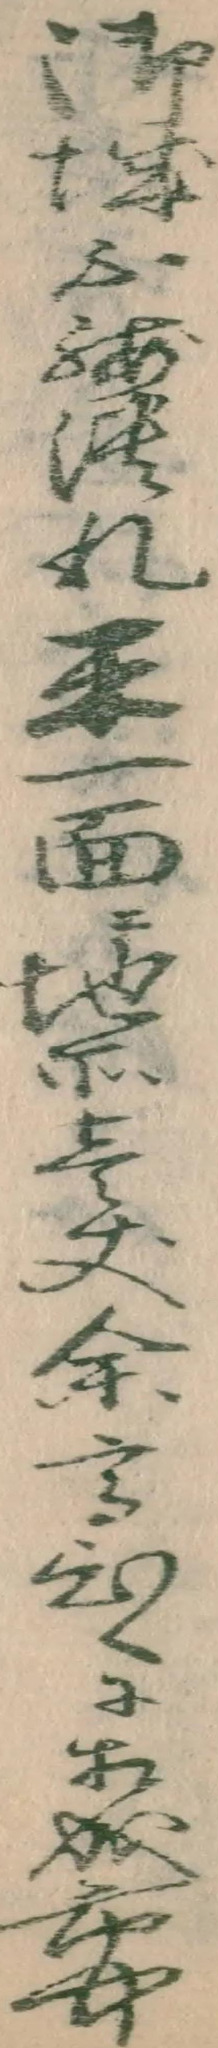御城不残潰れ平一面ニ地所壱丈余高ひくに相成市中
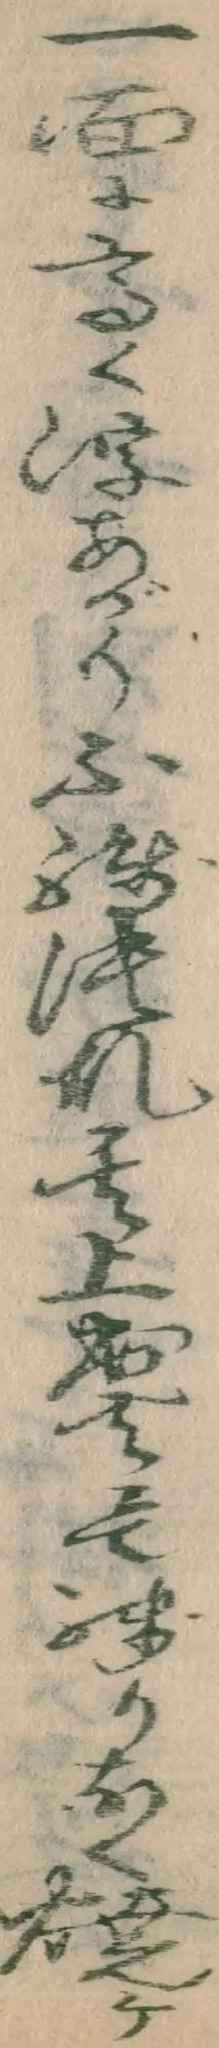一面に高く浮あがり不残潰れ其上出合ニて残りなく焼ケ
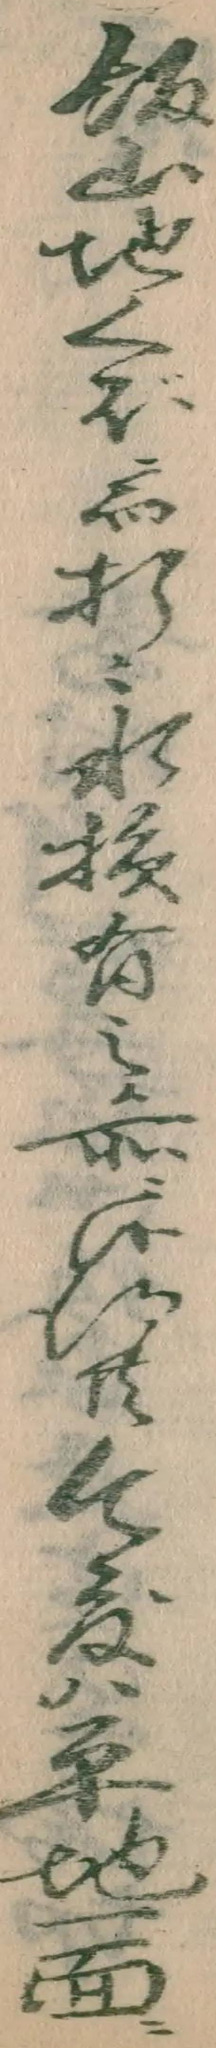飯山地くぼニ而折〻水損有之候所ニ候得共今度ハ平地一面ニ
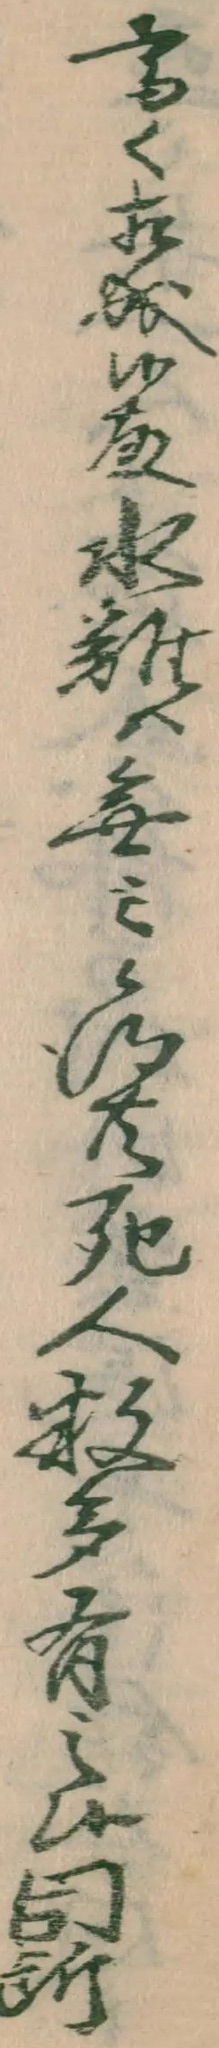高く相成候故水難は無之候得共死人数多有之外同所
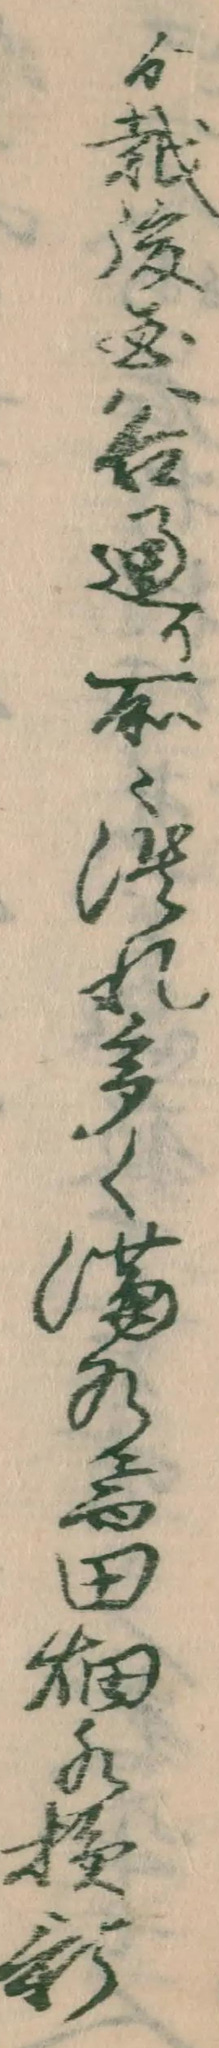ゟ越後国谷通り所〻潰れ多く満水ニ而田畠水損新
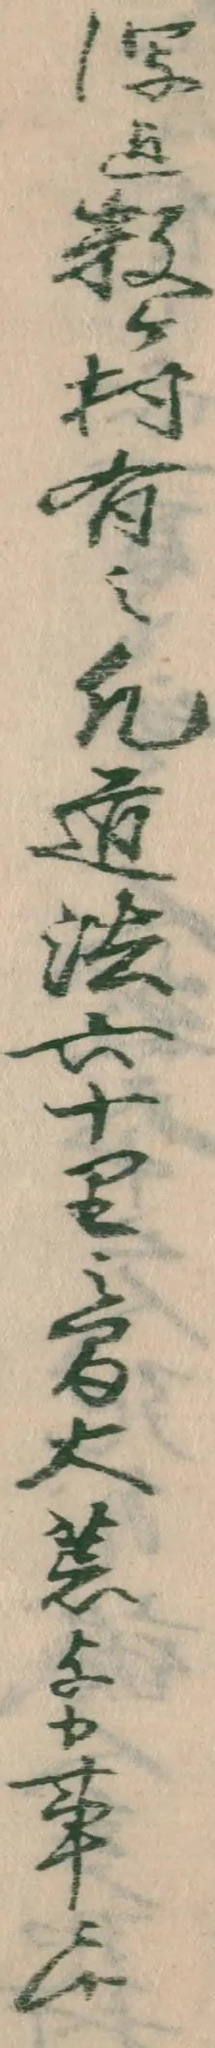潟迄数ケ村有之凡道法六十里之間大荒と申事ニ候
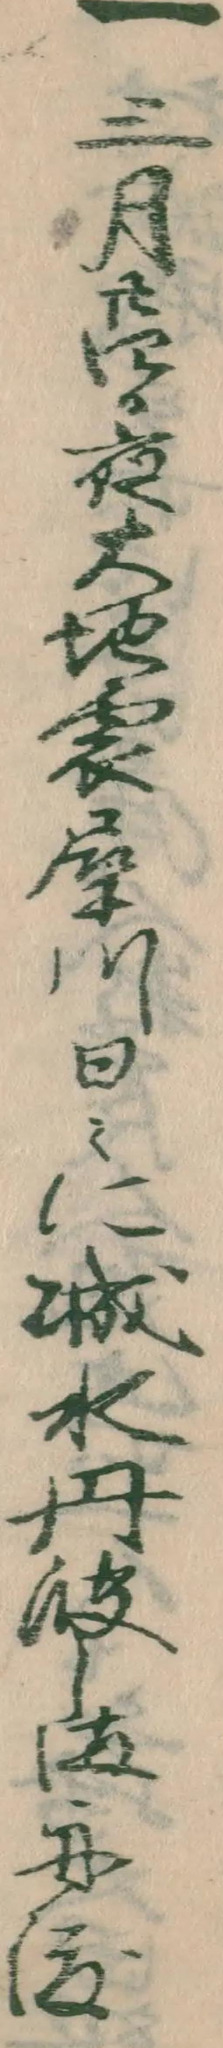一三月廿四日夜大地震犀川日〻に減水丹波しま舟渡
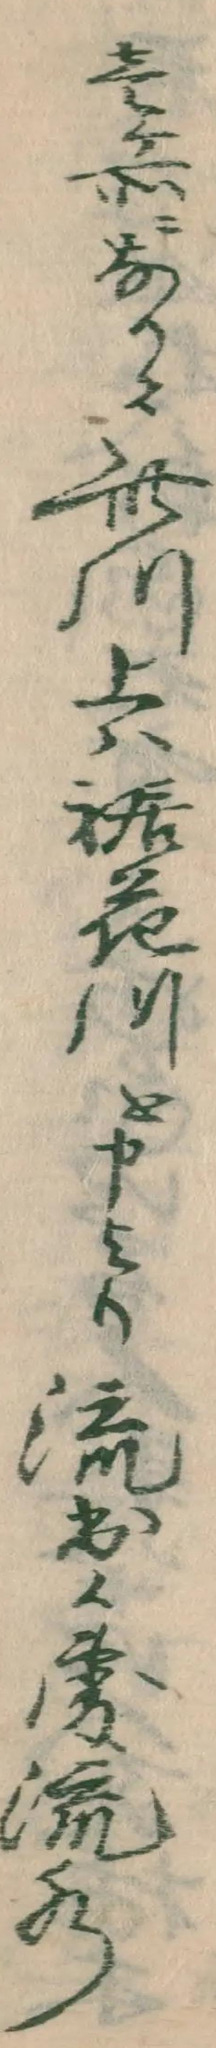壱ケ所ニなり候此川上は裾花川と申より流出候處流水
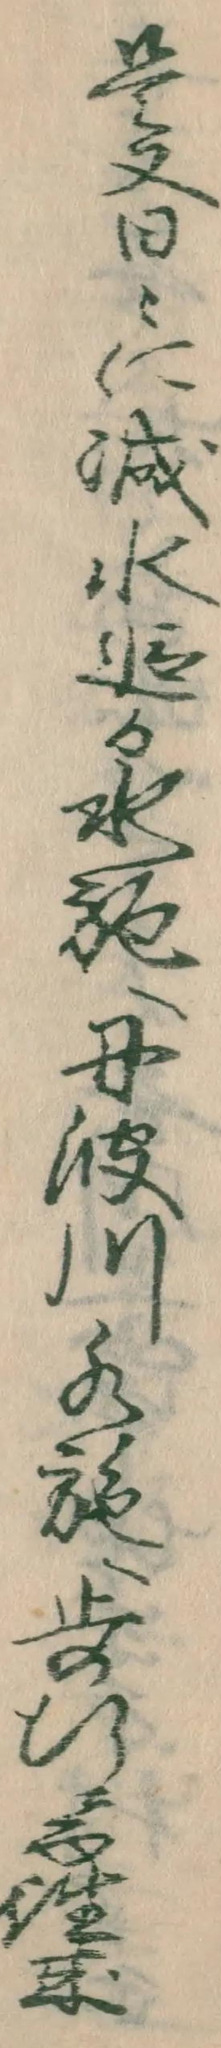是又日〻に減水追々水施へ丹波川水施へ歩行ニ而往来
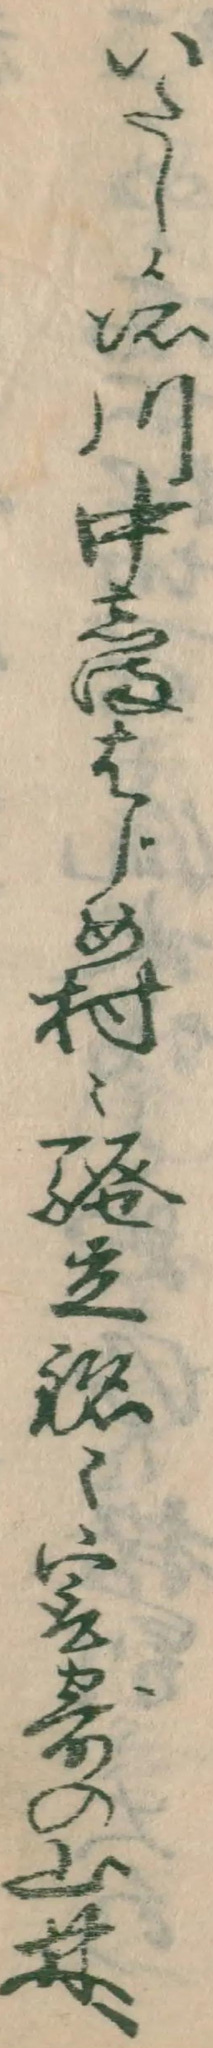いたし候所川中しまはじめ村〻騒立銘〻最寄の山林へ
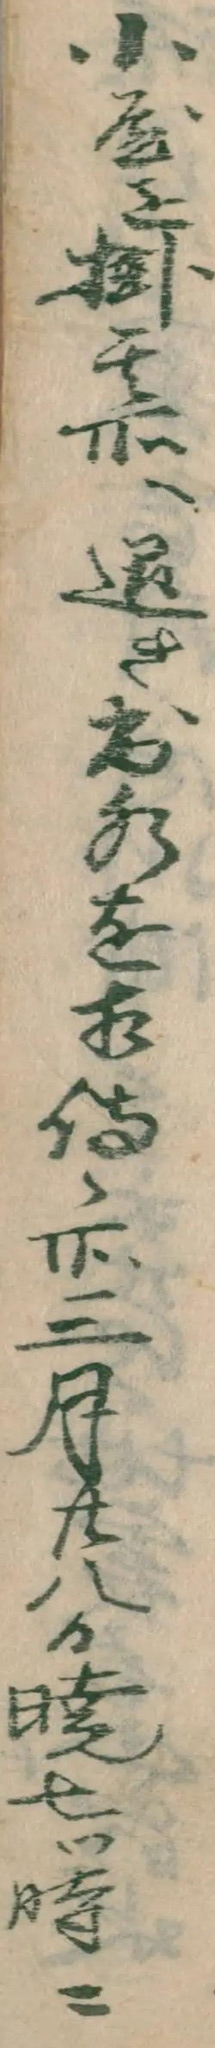小屋を掛其所へ退き出水を相待候所三月廿八日暁七ツ時ニ

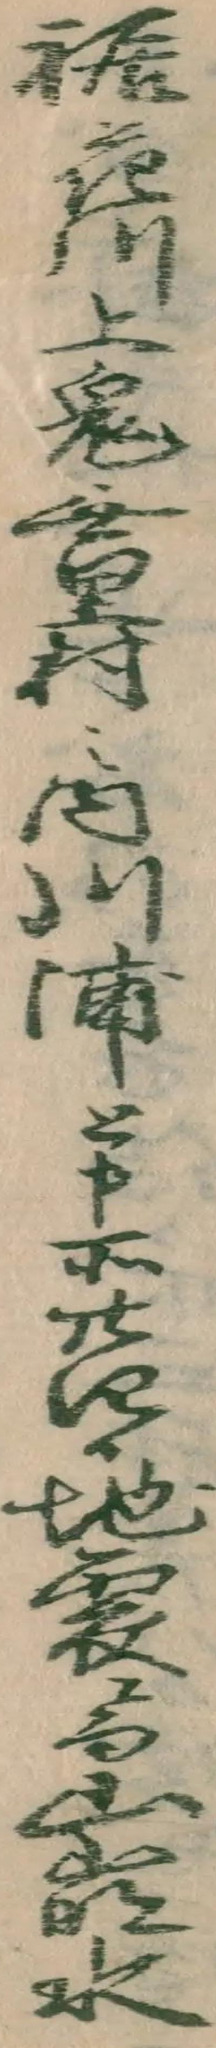裾花川上鬼無里村之内皮浦と申所廿四日地震ニ而山崩水
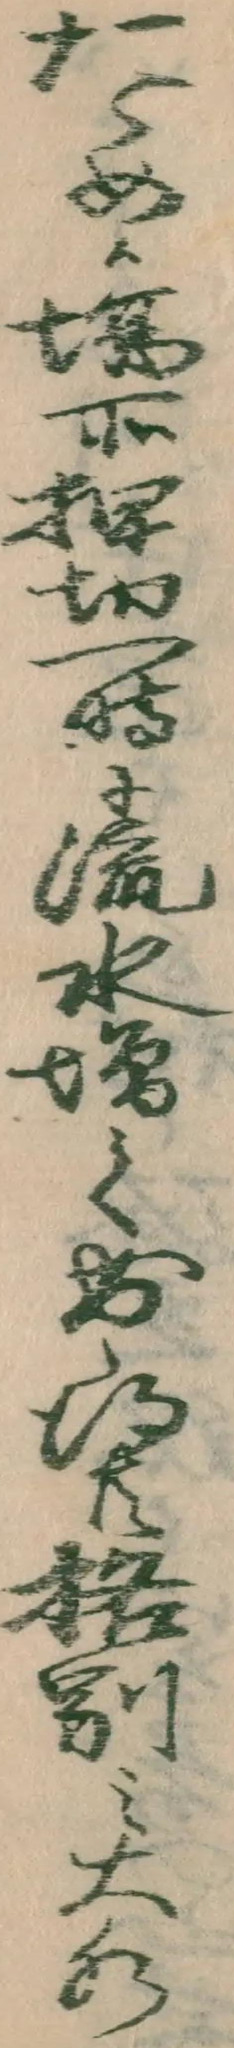たゝめ候場所押切一時に流水増て出候得共格別之大水
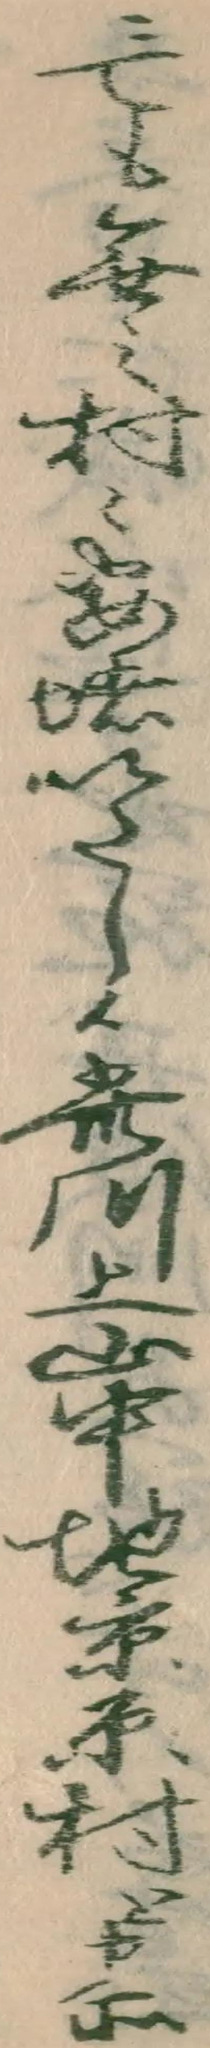ニても無之村〻安堵いたし候此川上山中地京原村と申所
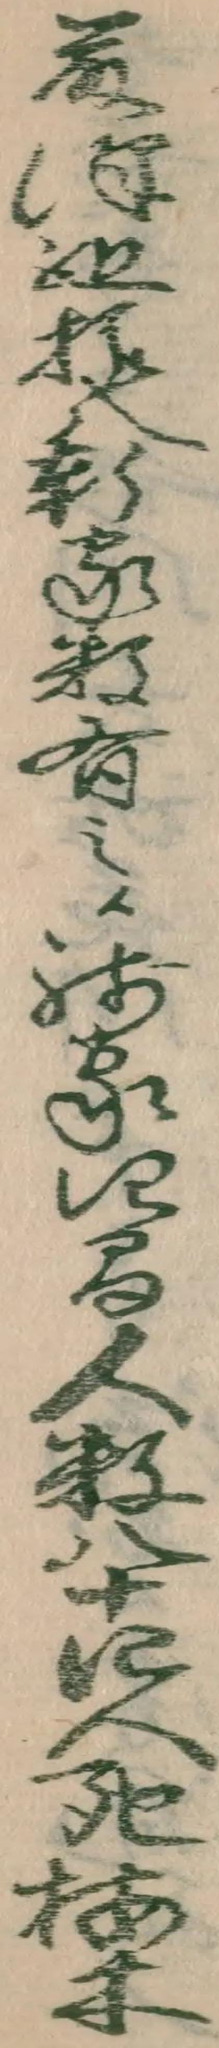藤沢組拾八軒家数有之候残家四間人数八十四人死梅木
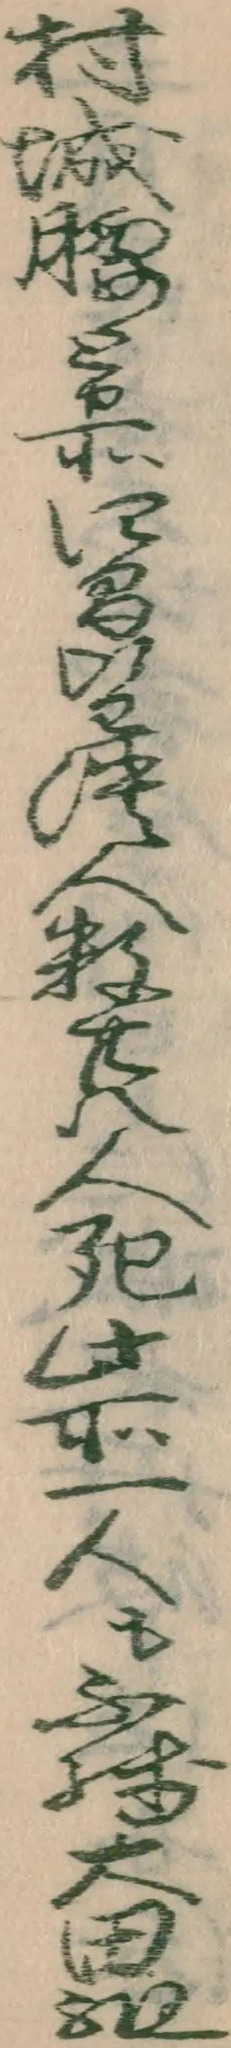村城腰と申所四間皆潰人数廿八人死此所一人も不残大田組
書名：大地震
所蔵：国立国会図書館 National Diet Library, JAPAN
